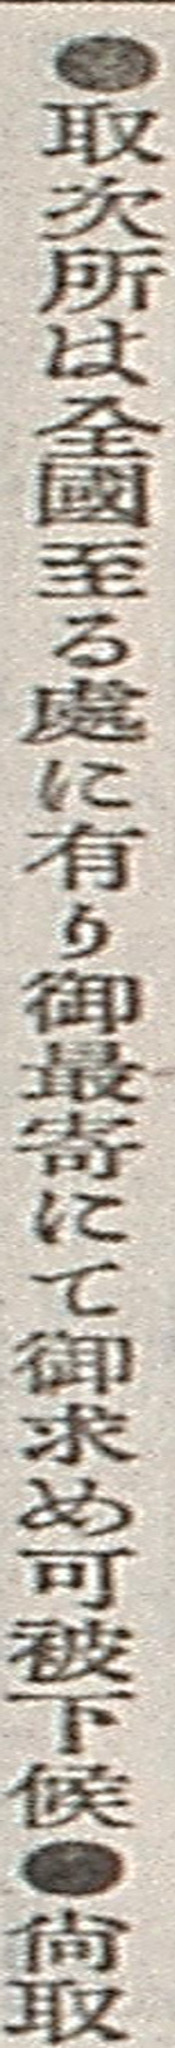●取次所は全国至る処に有り御最寄にて御求め可被下候●尚取

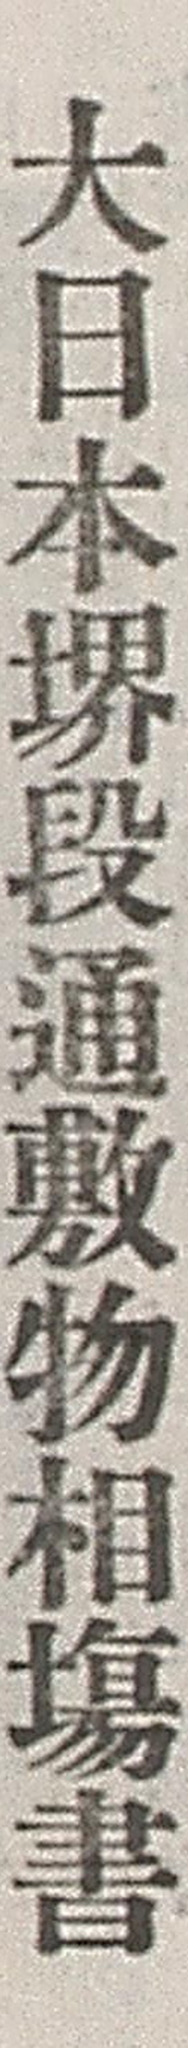大日本堺段通敷物相場書
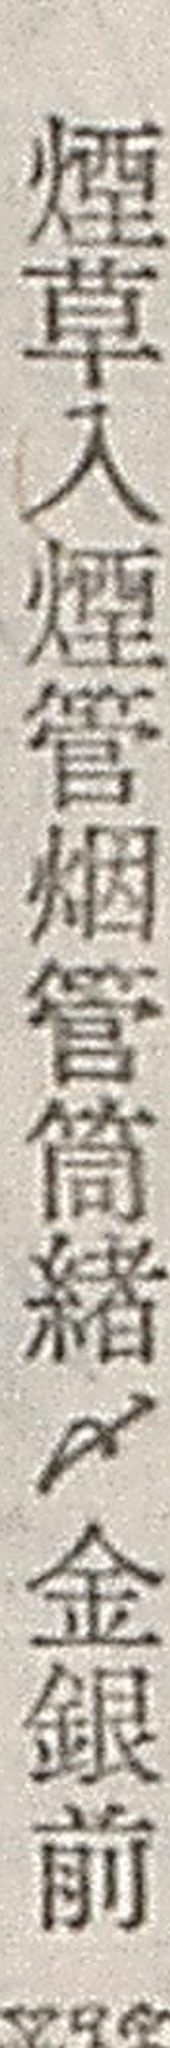煙草入煙管烟管筒緒〆金銀前
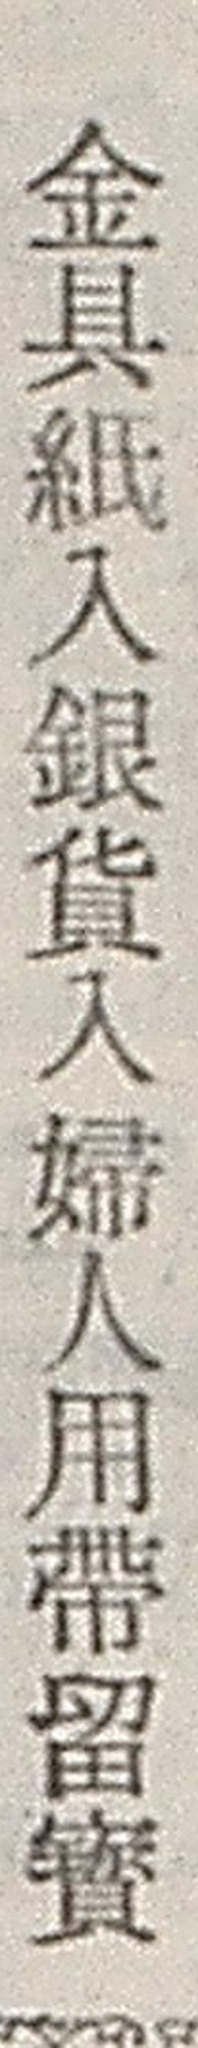金具紙入銀貨入婦人用帯留宝
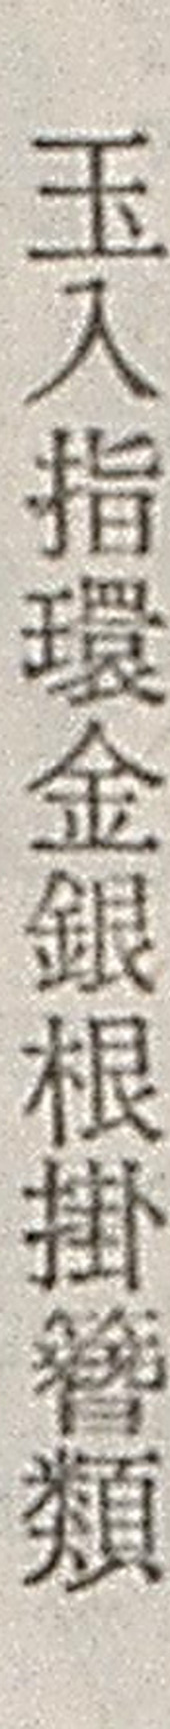玉入指環金銀根掛簪類
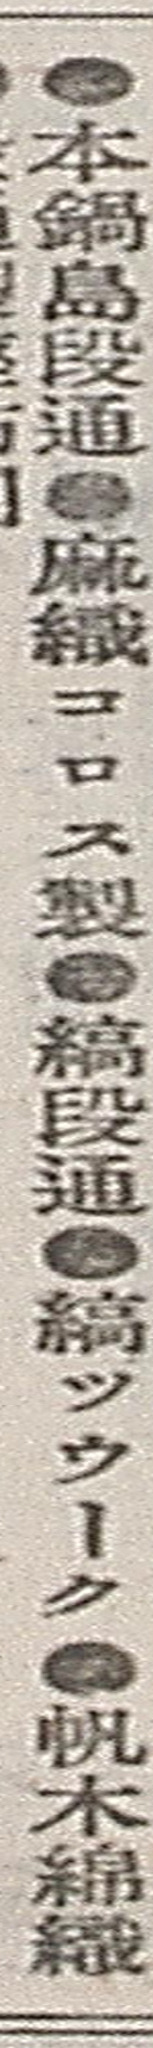●本鍋島段通●麻織コロス製●縞段通●縞ツウーク●帆木綿織
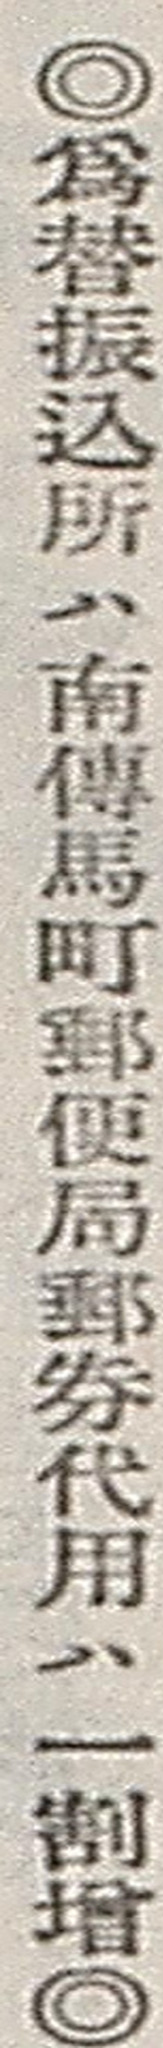◎為替振込所ハ南伝馬町郵便局郵券代用ハ一割増◎
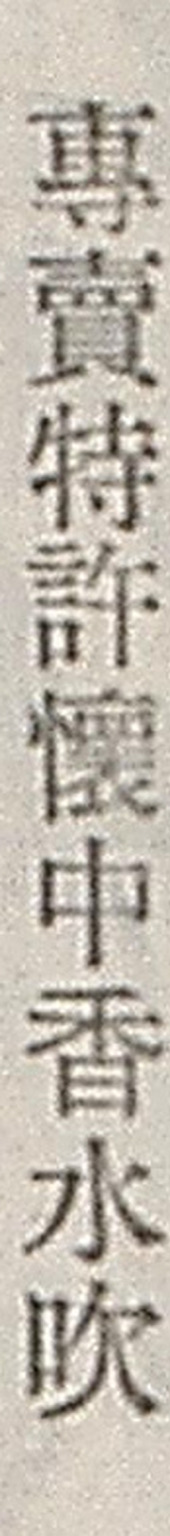専売特許懐中香水吹
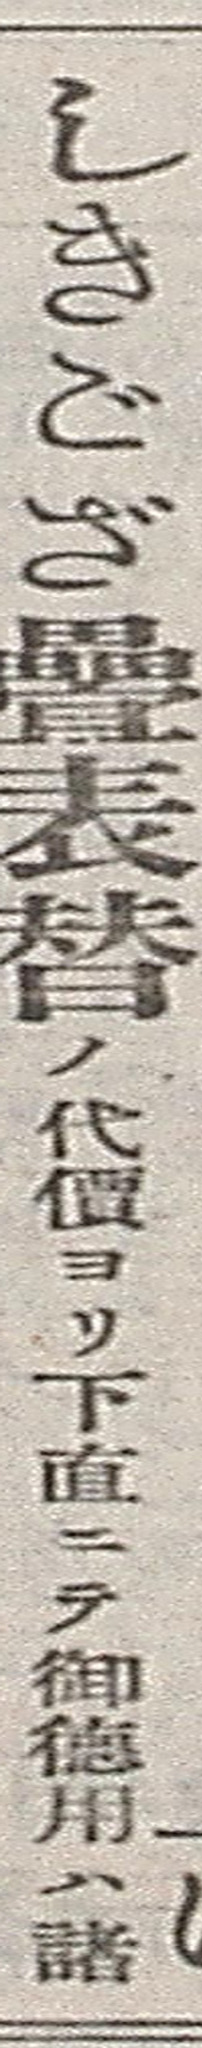しきござ畳表替ノ代価ヨリ下直ニテ御徳用ハ諸
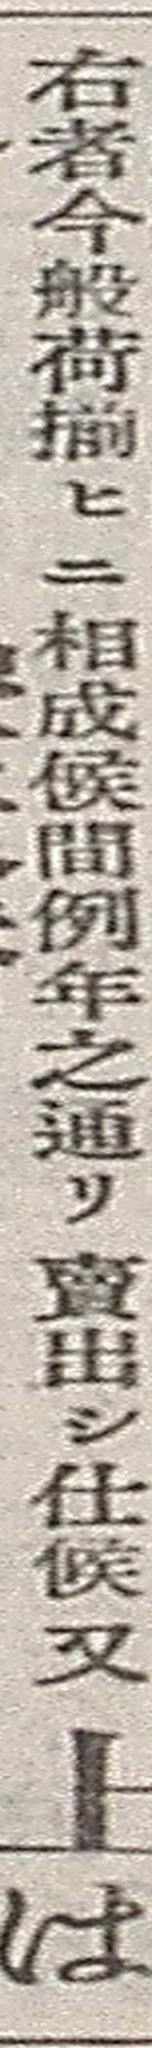右者今般荷揃ヒニ相成候間例年之通リ売出シ仕候又上は
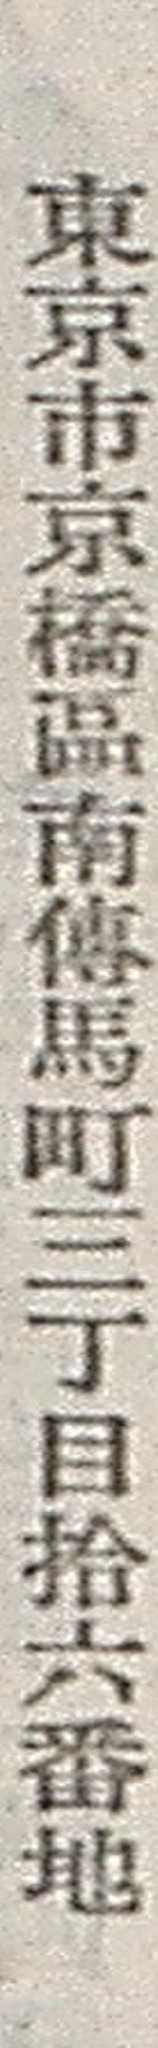東京市京橋区南伝馬町三丁目拾六番地
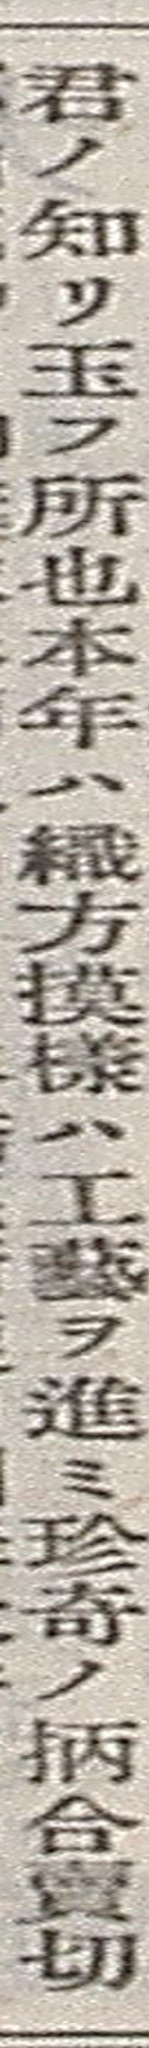君ノ知リ玉フ所也本年ハ織方模様ハ工芸ヲ進ミ珍奇ノ柄合売切
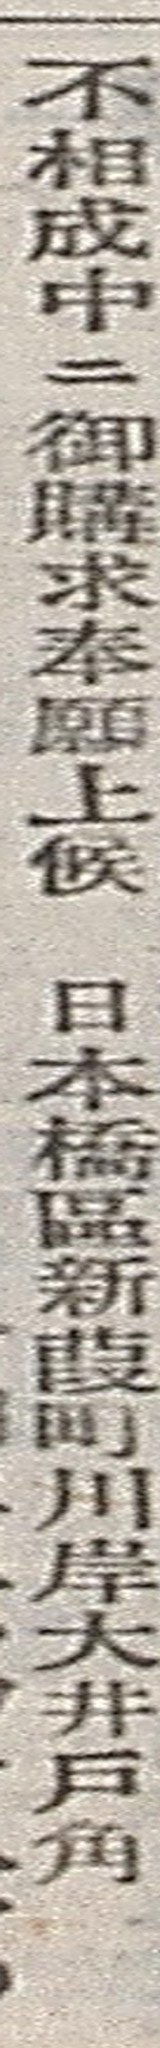不相成中ニ御購求奉願上候日本橋区新葭町川岸大井戸角
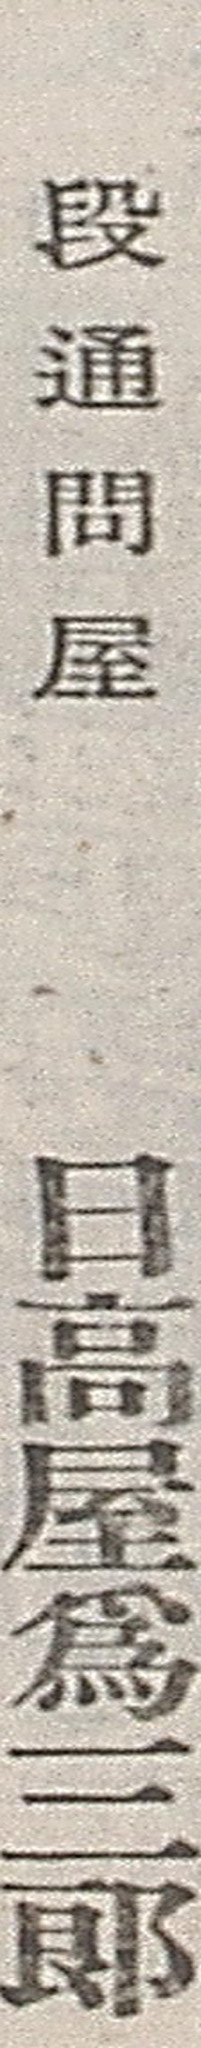段通問屋日高屋為三郎
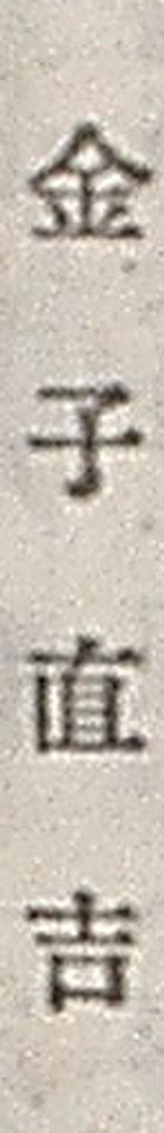金子直吉
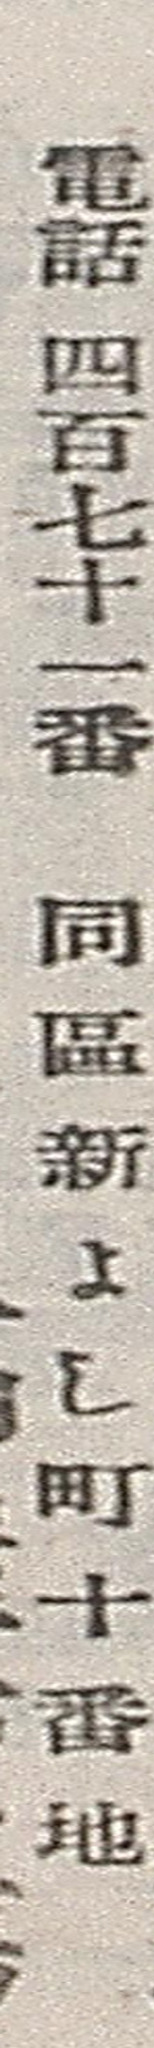電話四百七十一番同区新よし町十番地
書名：風俗畫報臨時増刊第百二十四號　洪水地震被害録（上）
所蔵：東京大学地震研究所図書室 Earthquake Research Institute Library, The University of Tokyo, JAPAN
